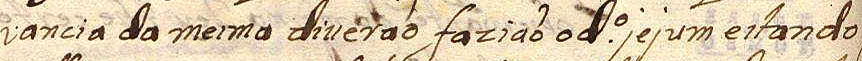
vancia da mesma disseraõ faziaõ o d.o jejum estando
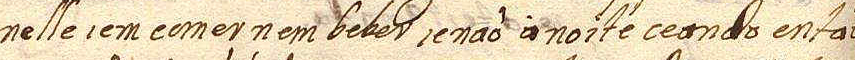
nelle sem comer, nem beber senaõ à noite ceando entaõ
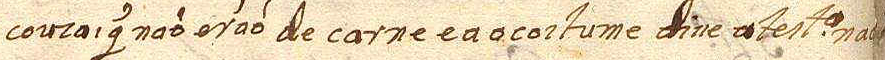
couzas q̄ naõ eraõ de carne e ao costume disse a test.a na
